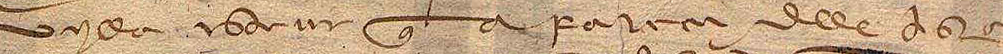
vylla esteue q̄ a pareçer delle testa
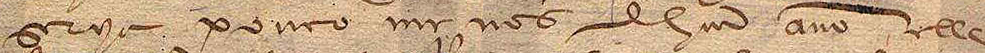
serya pouco menos de hū āno elle
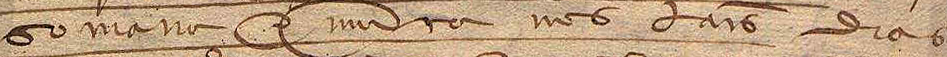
somana e nūca nos taēs dias
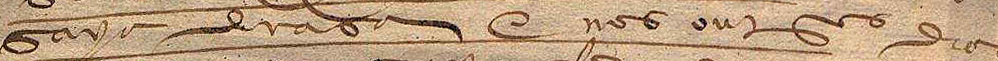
saya de casa e nos outos dias
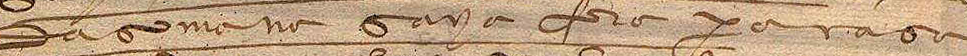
da somana saya fora ꝑa casa
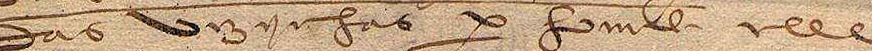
das vizynhas ꝑ homde elle
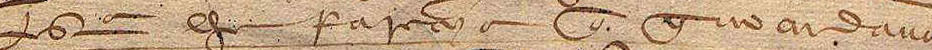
testa lhe parecya q̄ guoardaua
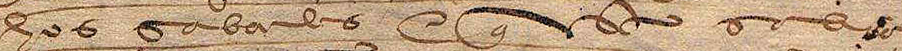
hos sabados e q̄ esto sabya
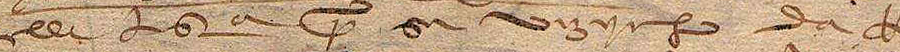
elle testa p̄o ser vizynho da Re
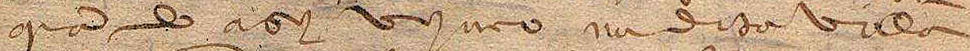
quādo asy vyueo na dita villa
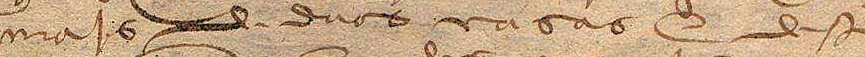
maJs de duas casas e deste
